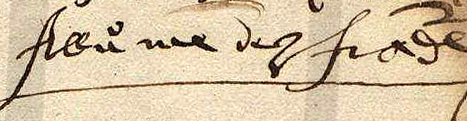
Alluo mēdez frade
